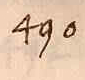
490
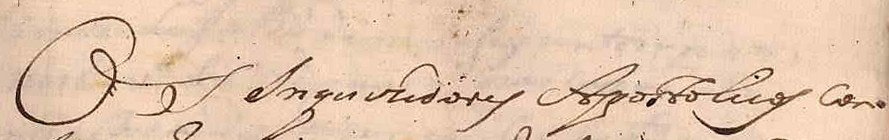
Os Inquizidores Apostolicos con
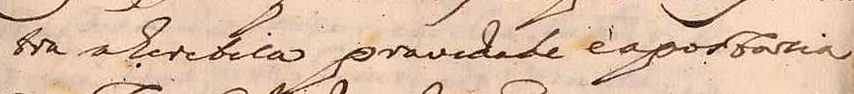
tra a heretica pravidade e apostazia
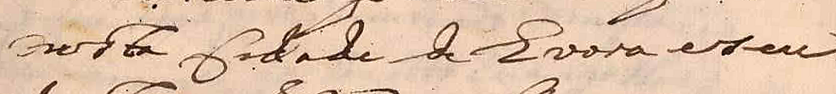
nesta Cidade de Evora e seu
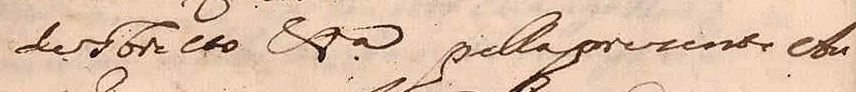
destricto &.a pella prezente Au
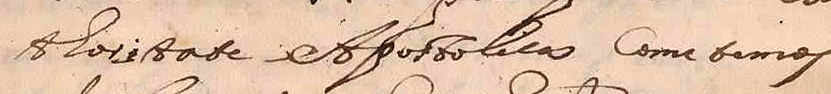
thoritate Apostolica Cometemos
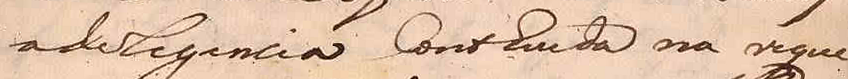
a deligencia Contheuda na reque
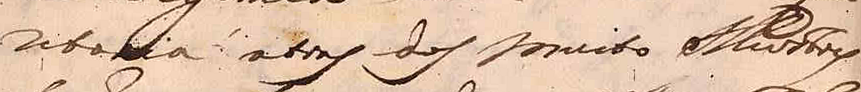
zitoria atras dos muito Illustres
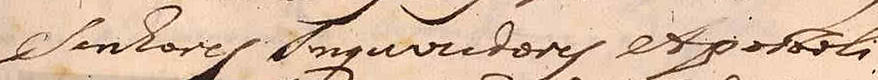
Senhores Inquizidores Apostoli
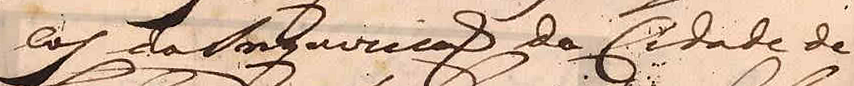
cos da Inquiziçaõ da Cidade de
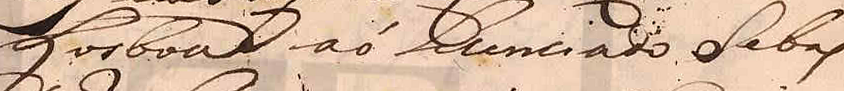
Lisboa ao Licenciado Sebas
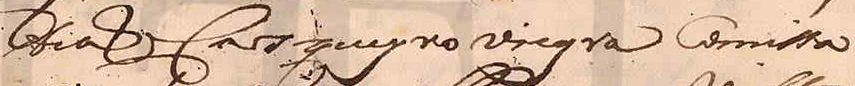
tiaõ Casqueyro vieyra Comissa
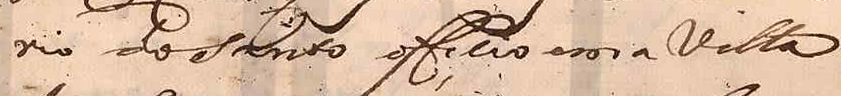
rio do Santo officio em a Villa
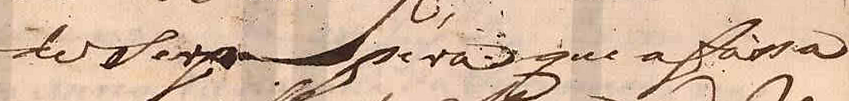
de Serpa pera que a fassa
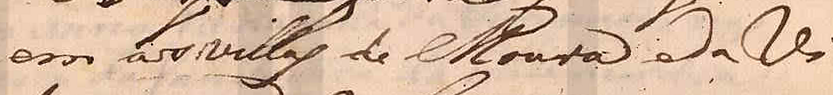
em as villas de Moura e da Vi
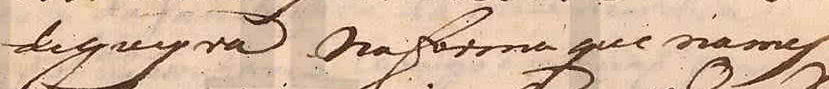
digueyra na forma que na mes
